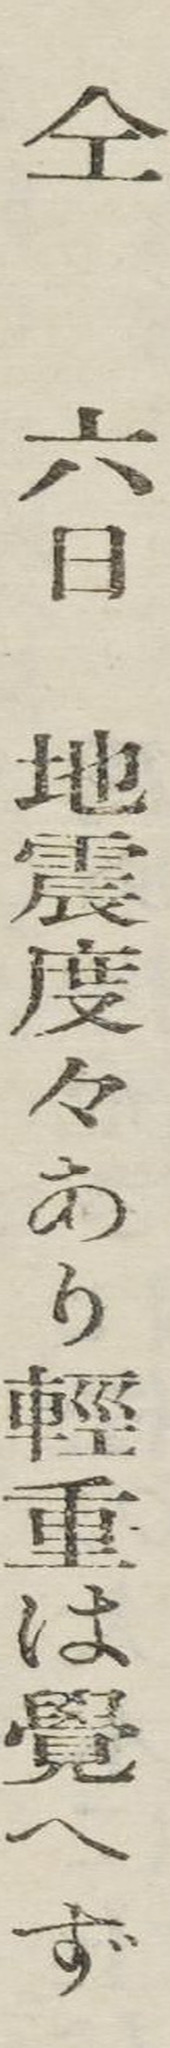仝六日地震度々あり軽重は覚へず
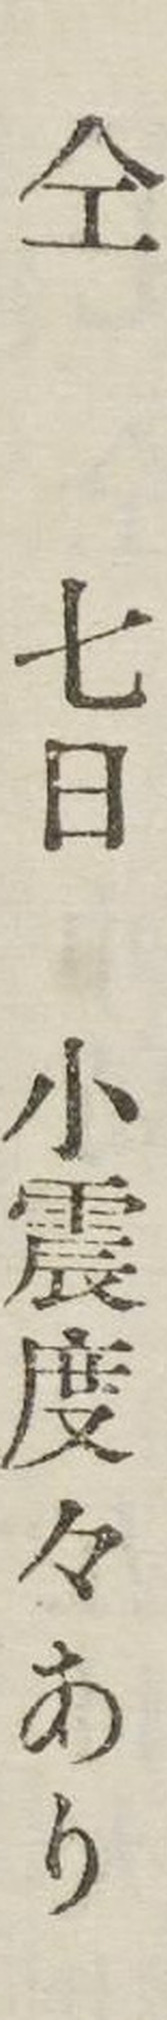仝七日小震度々あり
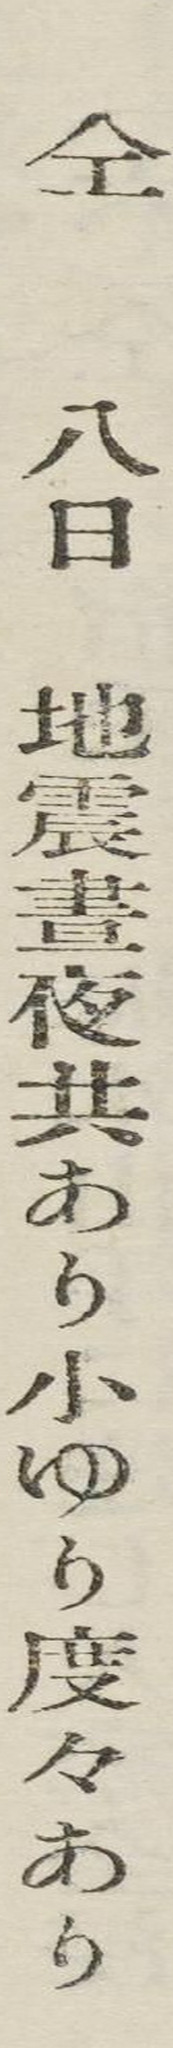仝八日地震昼夜共あり小ゆり度々あり
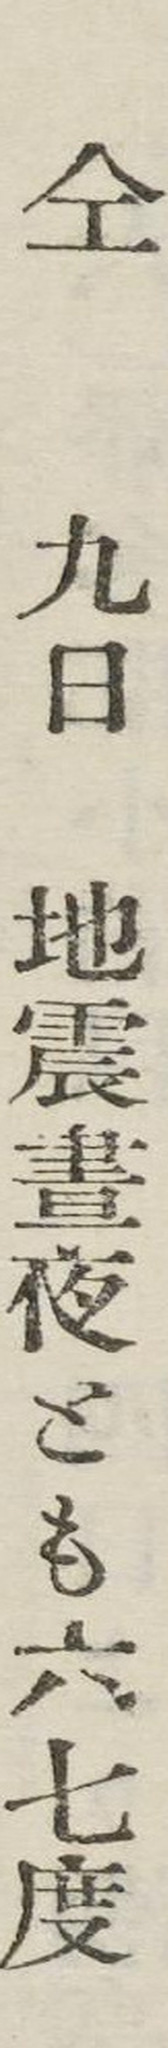仝九日地震昼夜とも六七度
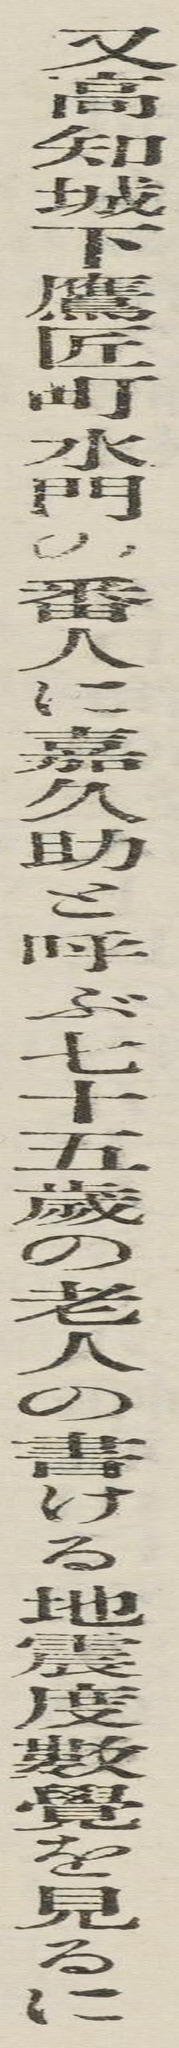又高知城下鷹匠町水門の番人嘉久助と呼ぶ七十五歳の老人の書ける地震度数覚を見るに
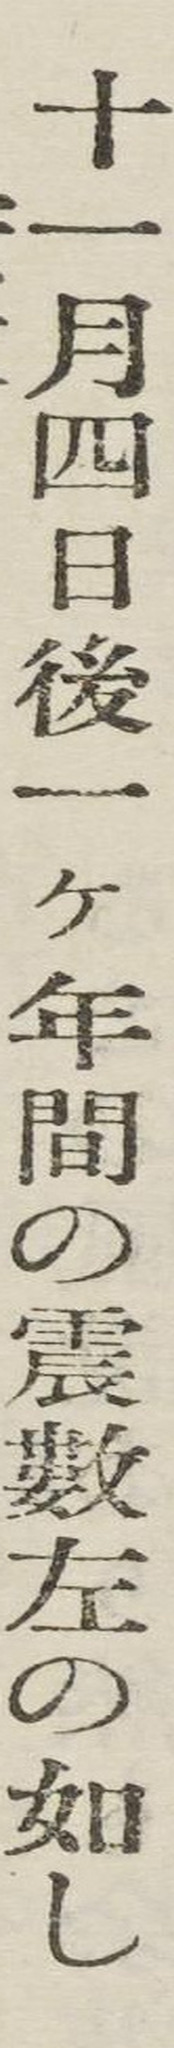十一月四日後一ヶ年間の震数左の如し
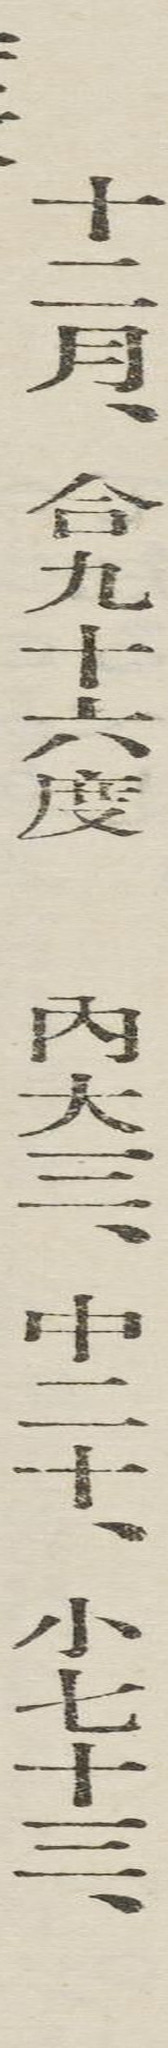一十二月、合九十六度内大三、中二十、小七十三、
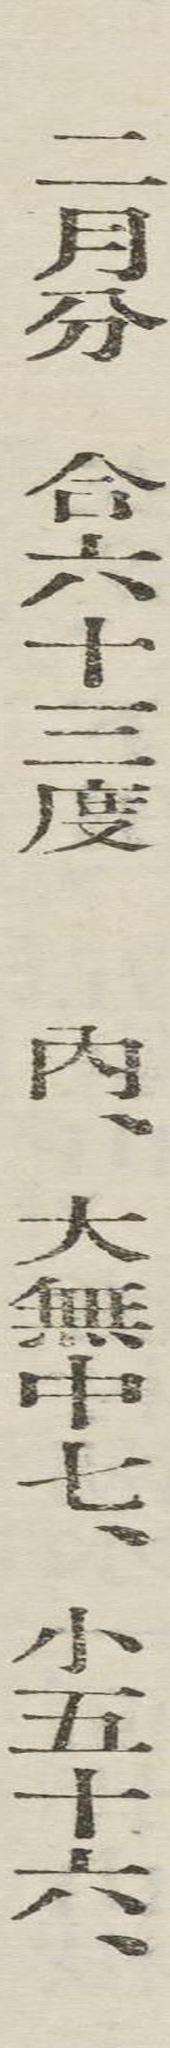二月分合六十三度内、大無中七、小五十六、
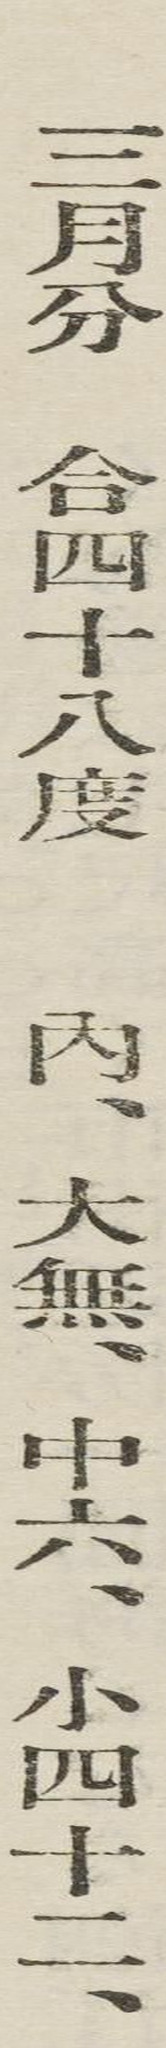三月分合四十八度内、大無、中六、小四十二、
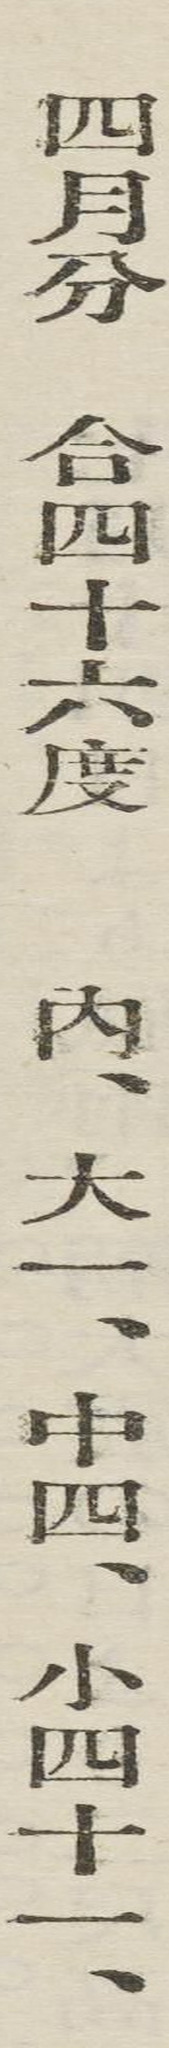四月分合四十六度内、大一、中四、小四十一、
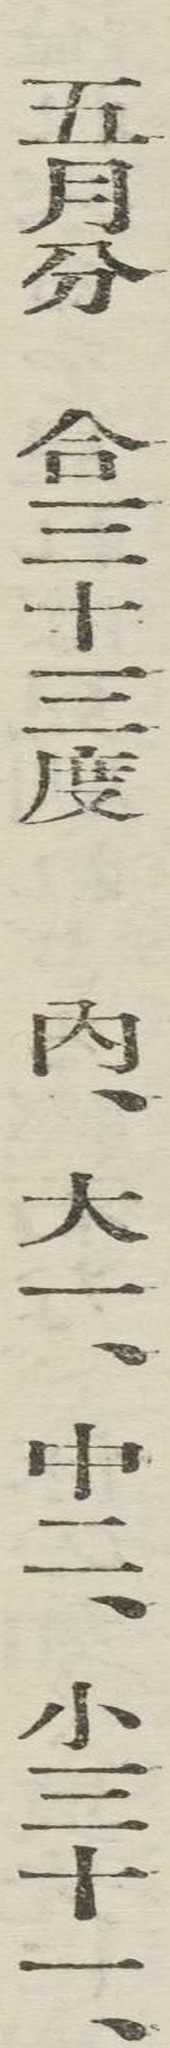五月分合三十三度内、大一、中二、小三十一、
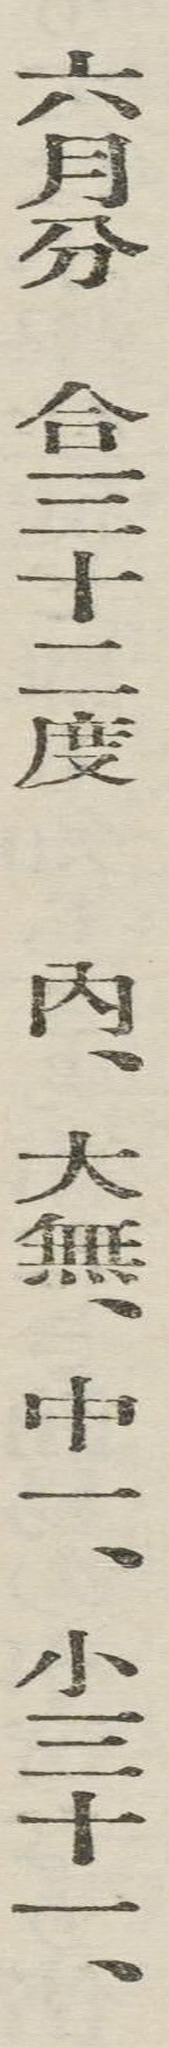六月分合三十二度内、大無、中一、小三十一、
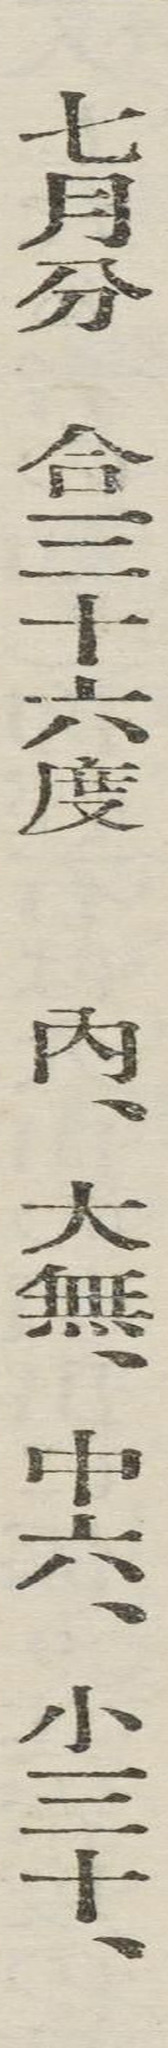七月分合三十六度内、大無、中六、小三十、
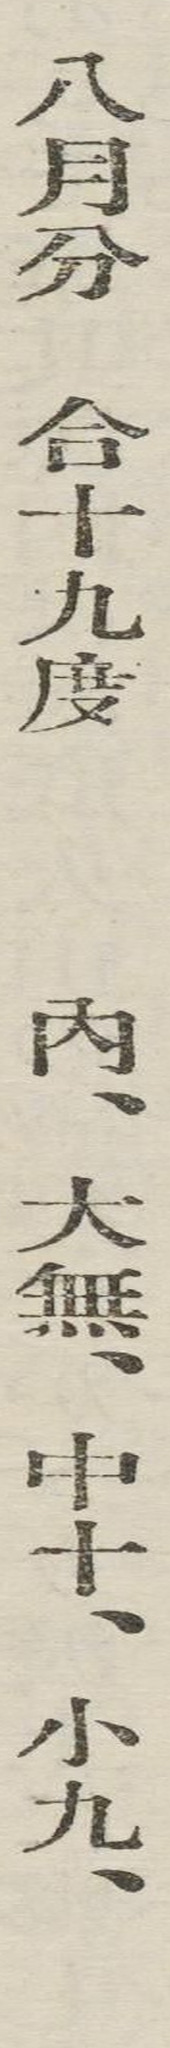八月分合十九度内、大無、中十、小九、
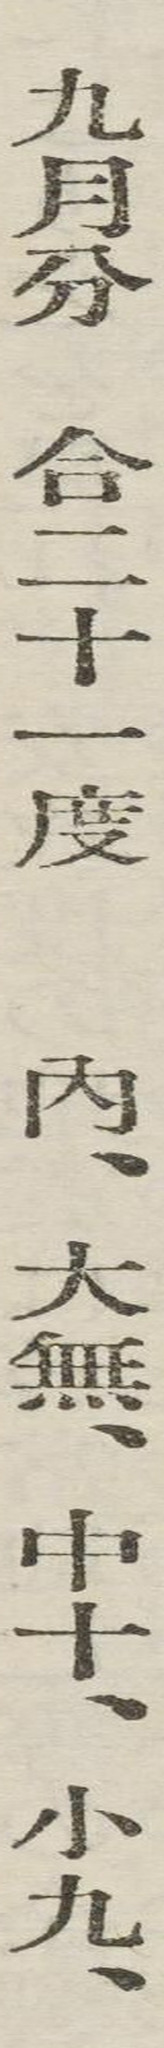九月分合二十一度内、大無、中十、小九、
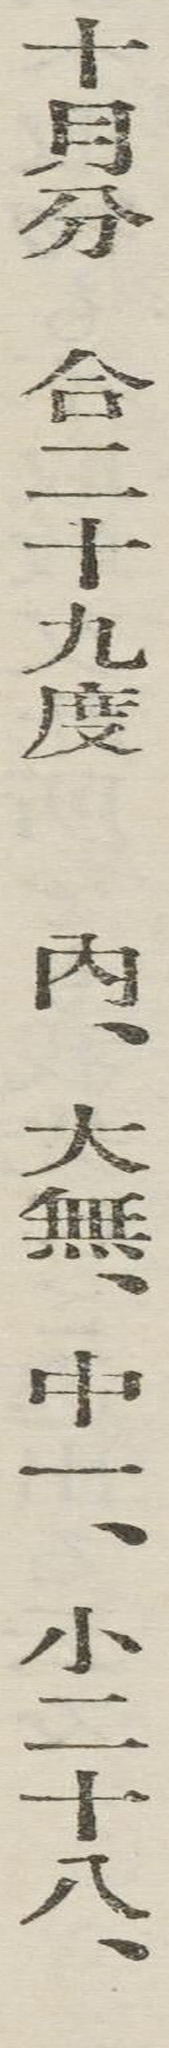十月分合二十九度内、大無、中一、小二十八、
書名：土佐古今ノ地震
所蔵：東京大学地震研究所図書室 Earthquake Research Institute Library, The University of Tokyo, JAPAN
